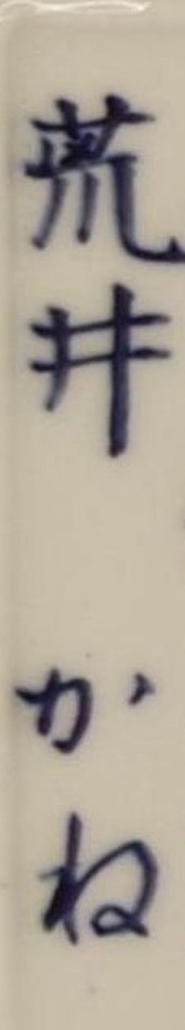荒井かね

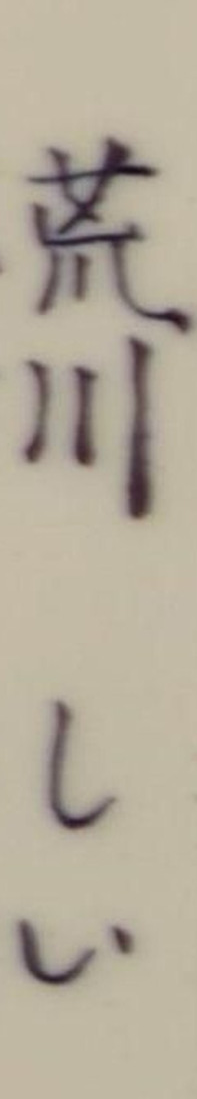荒川しい
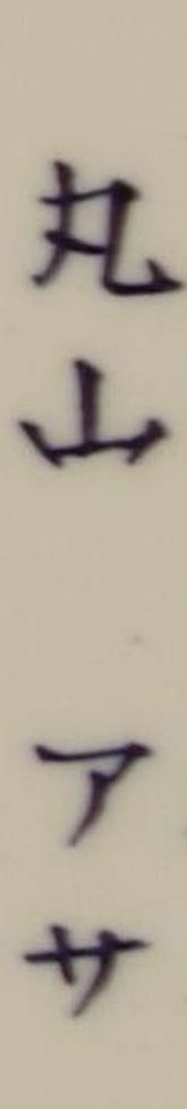丸山アサ
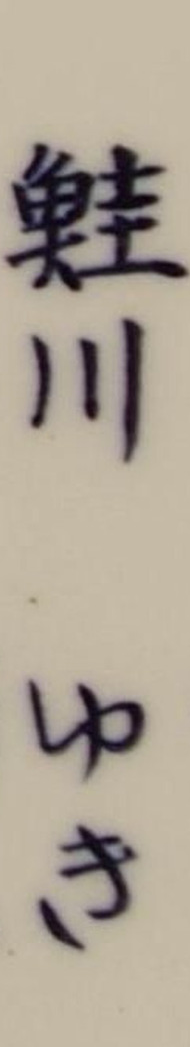鮭川ゆき
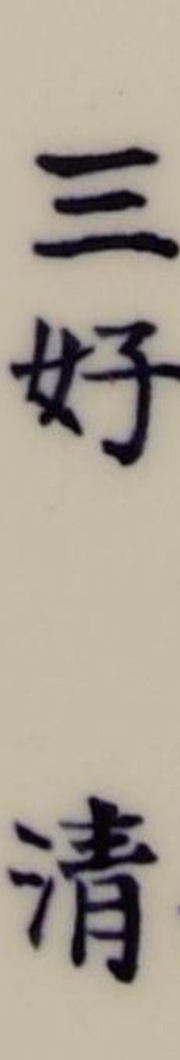三好清
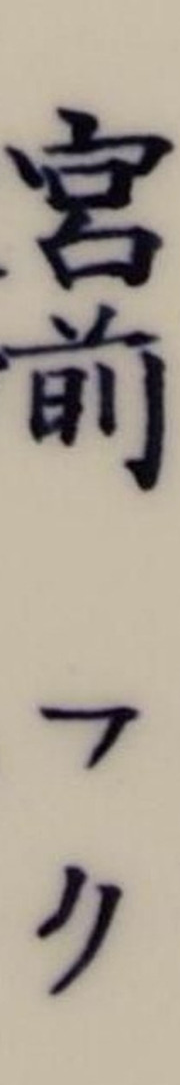宮前フク
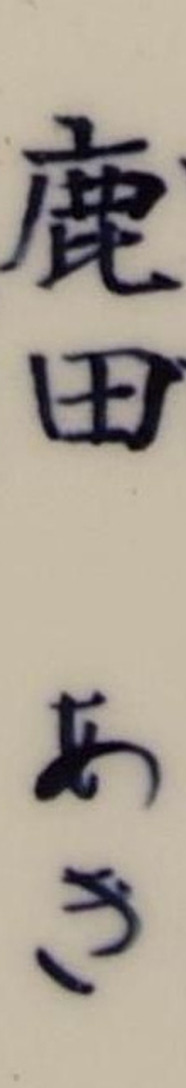鹿田あき
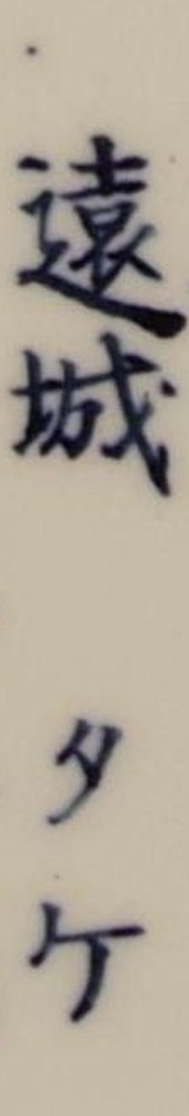遠城タケ
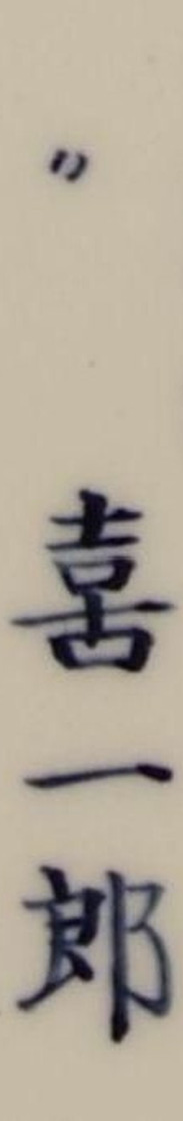喜一郎
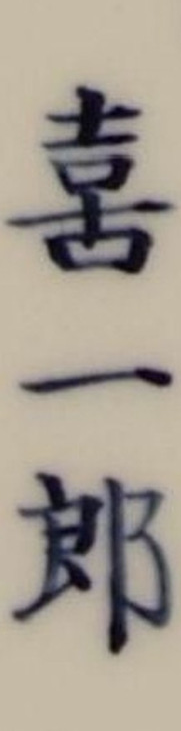喜一郎
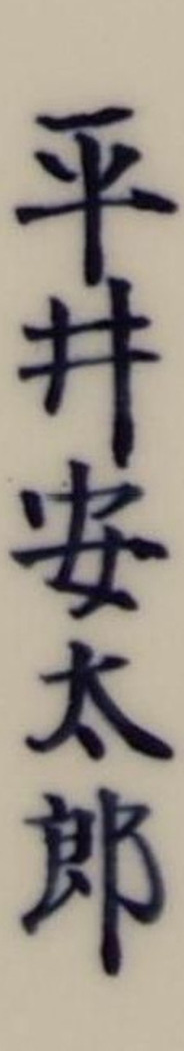平井安太郎
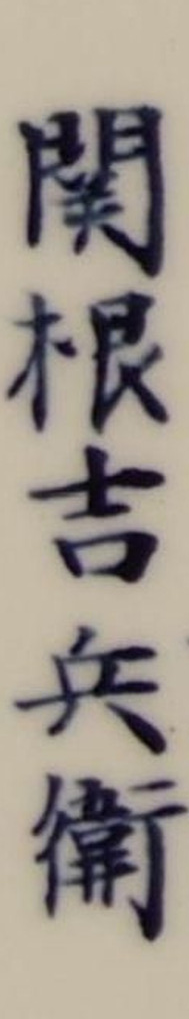関根吉兵衛

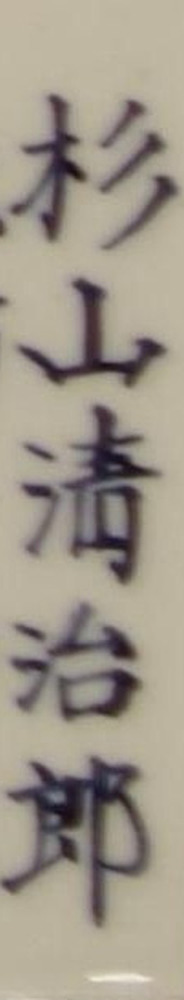杉山清治郎
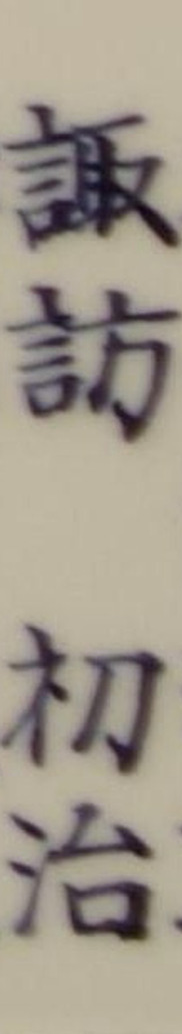諏訪初治
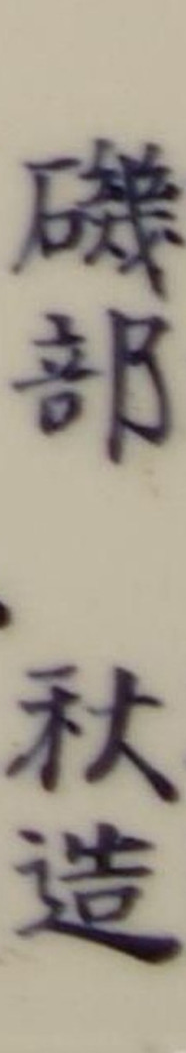磯部秋造
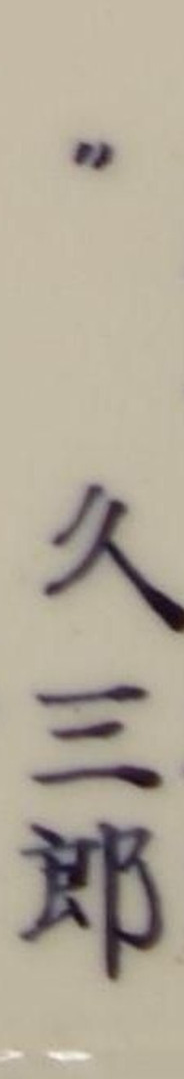久三郎
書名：E~L
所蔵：高野山金剛峯寺
